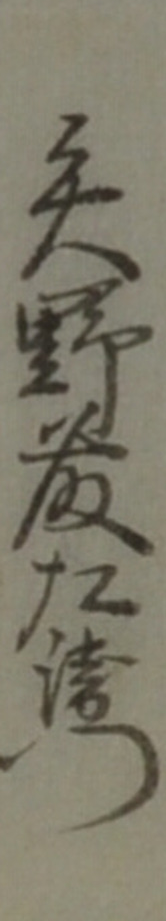矢野藤左衛門
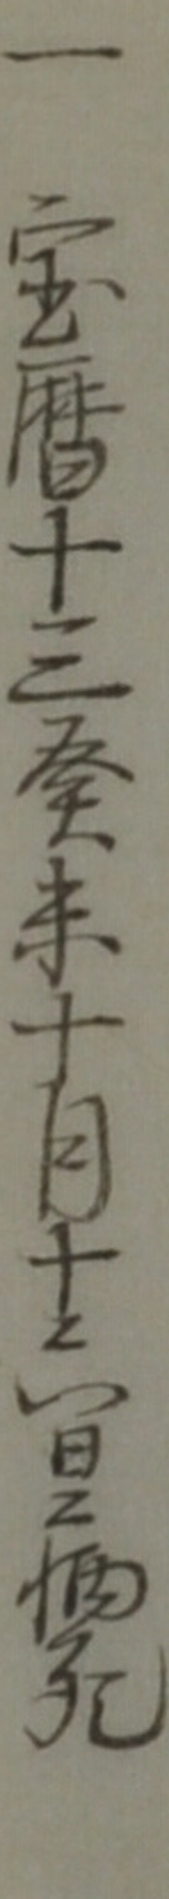一宝暦十三癸未十月十六日病死
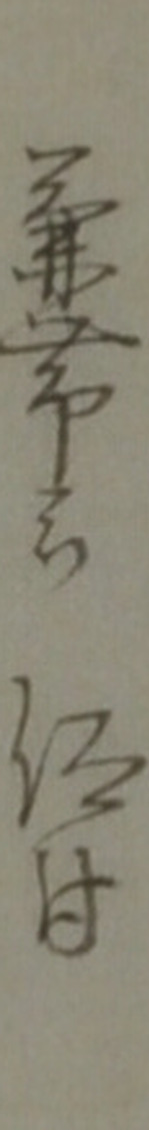兼帯被仰付
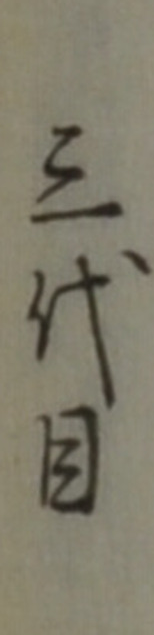三代目
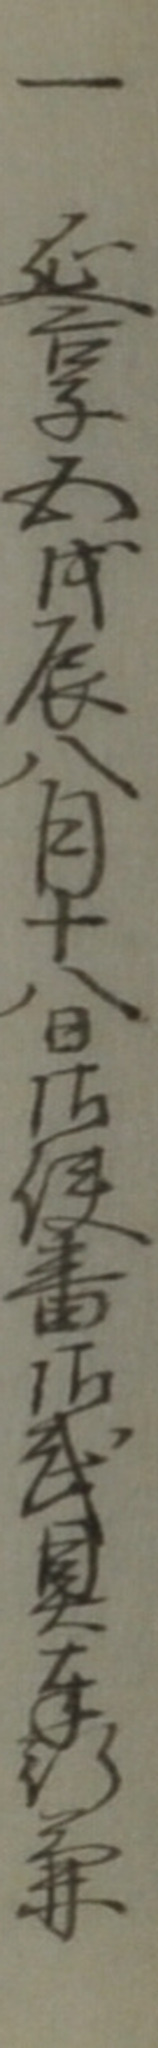一延享五戊辰八月十八日御使番御武具奉行兼
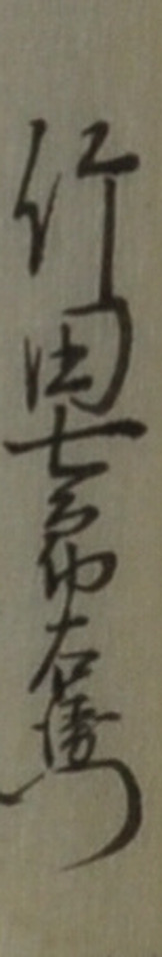竹田七郎右衛門
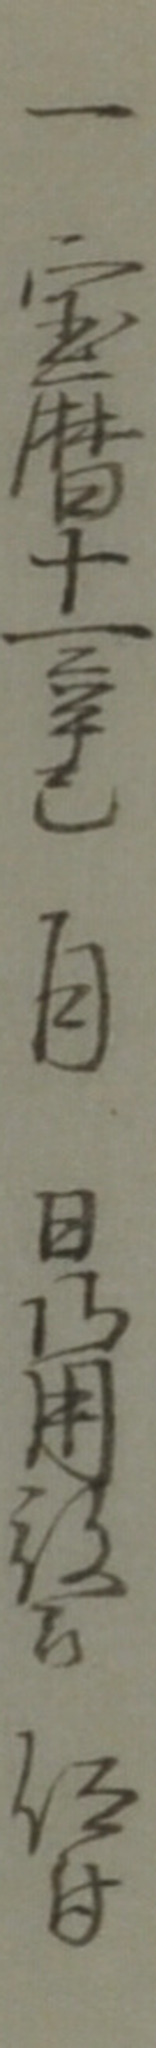一宝暦十一辛巳月日御用役被仰付
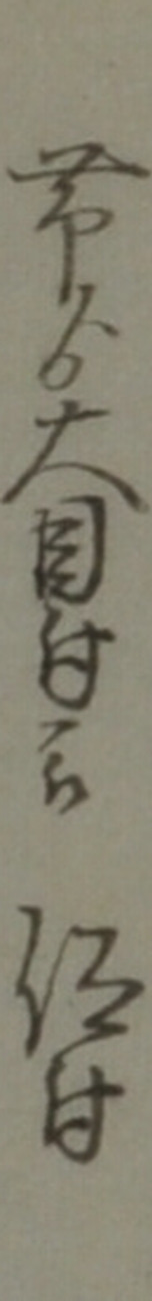帯ゟ大目付被仰付
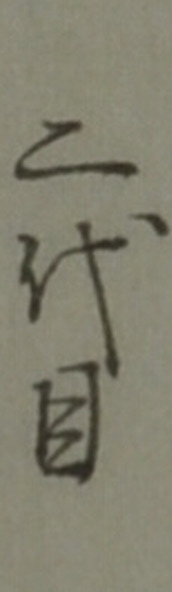二代目
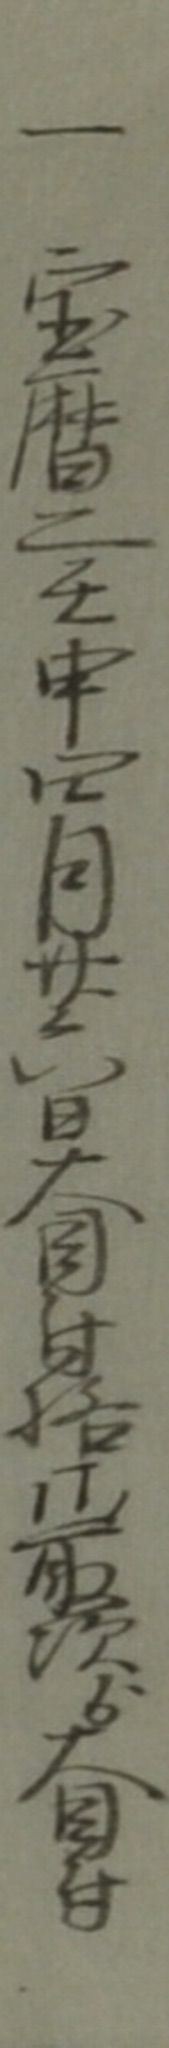一宝暦二壬申四月廿六日大目付格御取次ゟ大目付
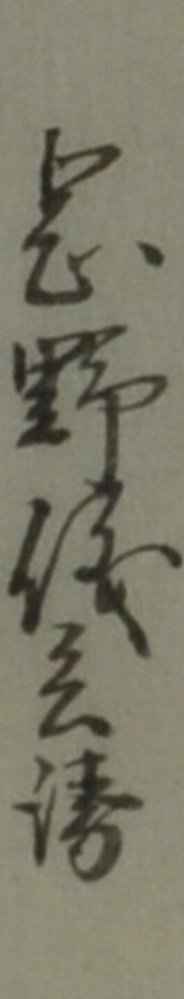岡野儀兵衛
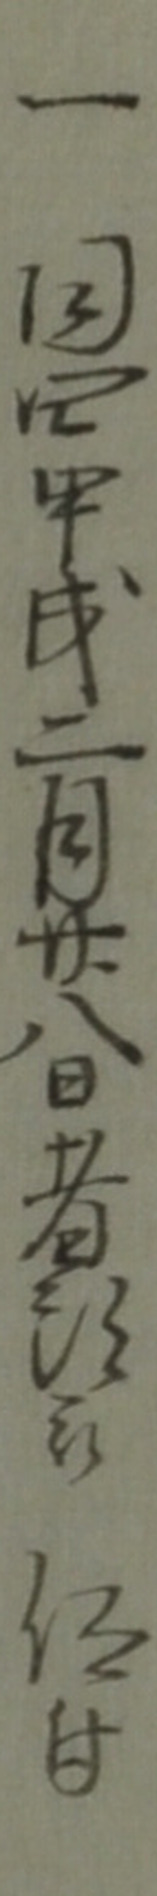一同四甲戌二月廿八日者頭被仰付
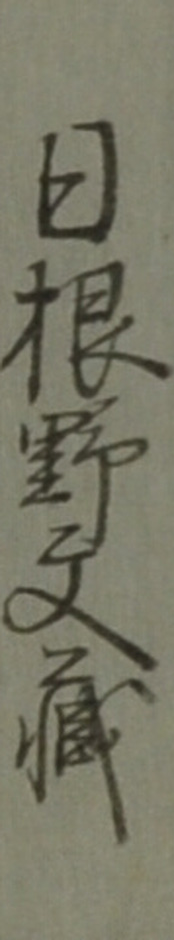日根野文蔵
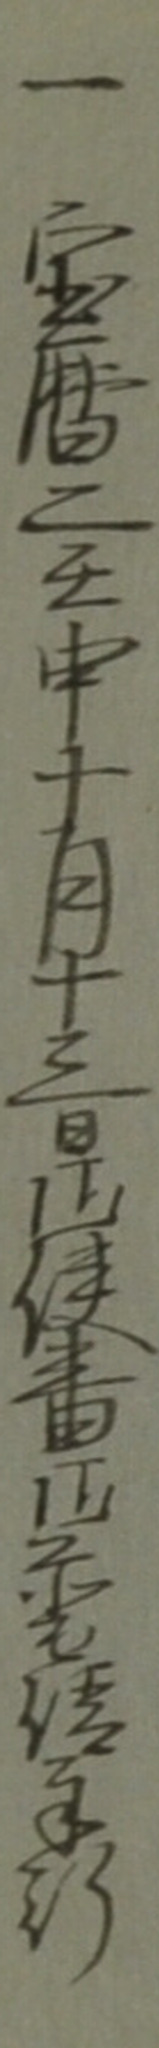一宝暦二壬申十月十三日御使番御普請奉行
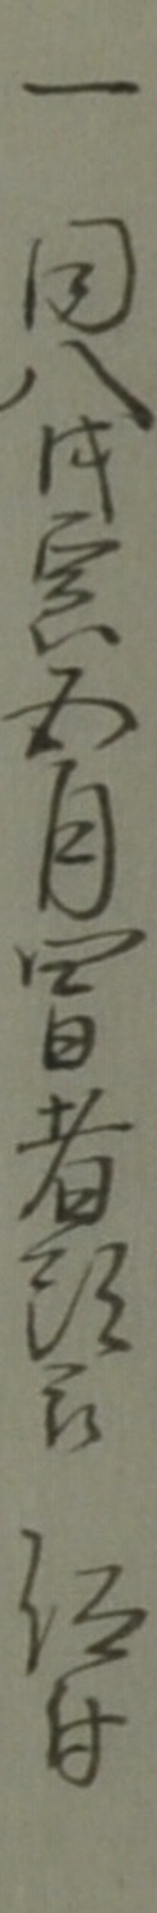一同八戊寅五月四日者頭被仰付
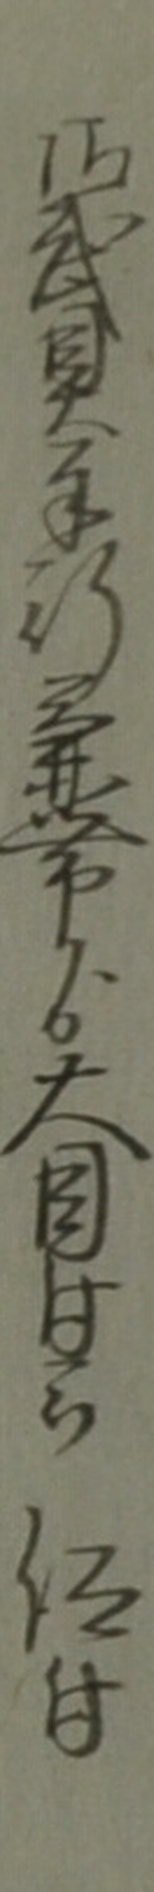御武具奉行兼帯ゟ大目付被仰付
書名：諸御役代々録（三）
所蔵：伊那市立高遠町図書館・合同会社AMANE
